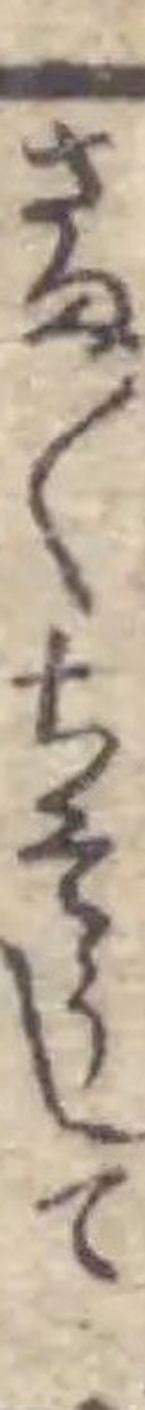さま〳〵ちそうして
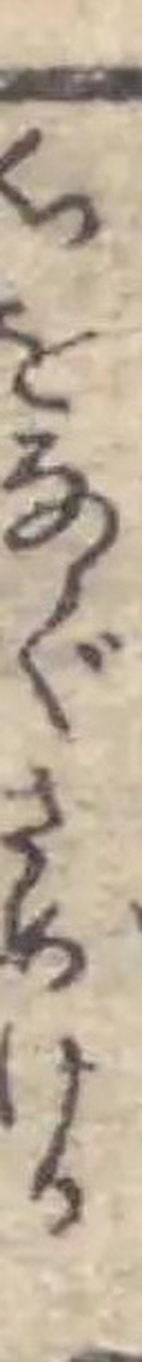心をなぐさめける
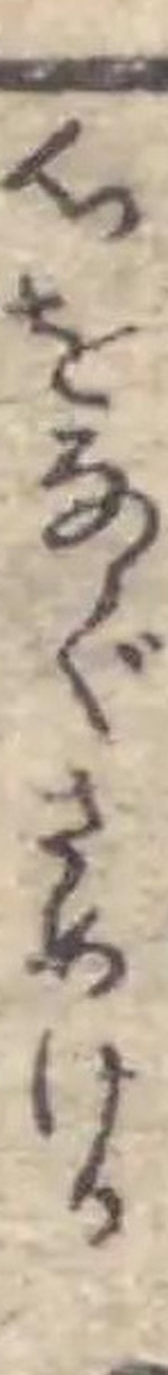心をなぐさめける
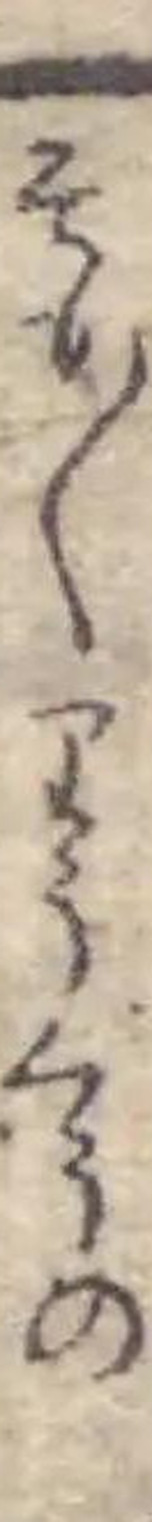そも〳〵りうくうの
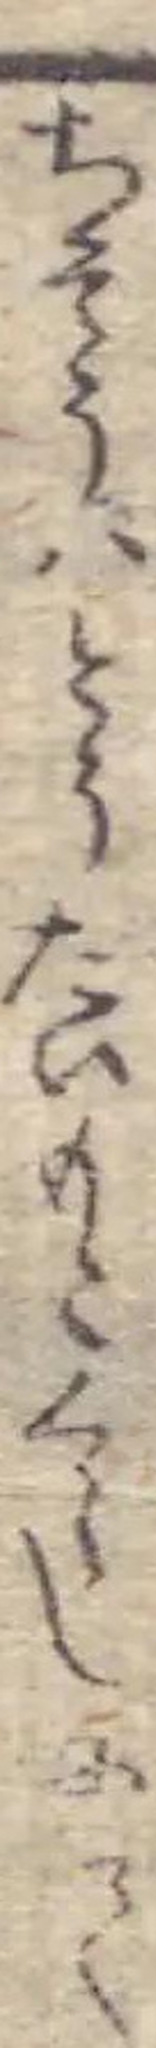ちそうはとうたいもとくらしにて
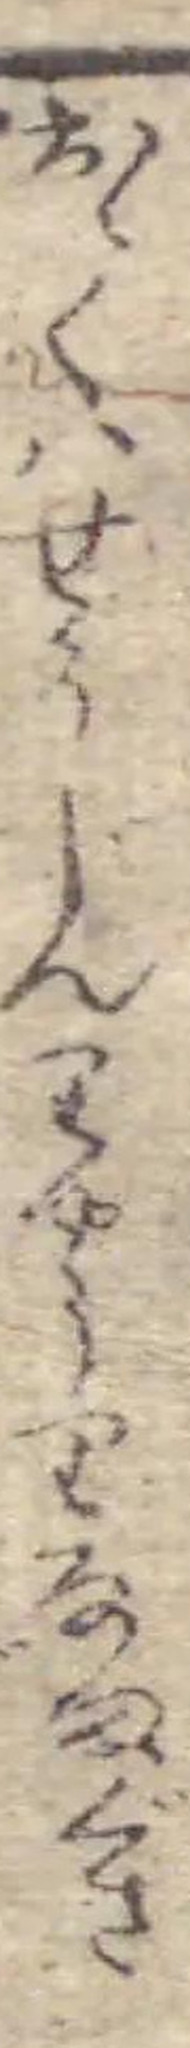おゝくはせうしんりやうりなまぐさ
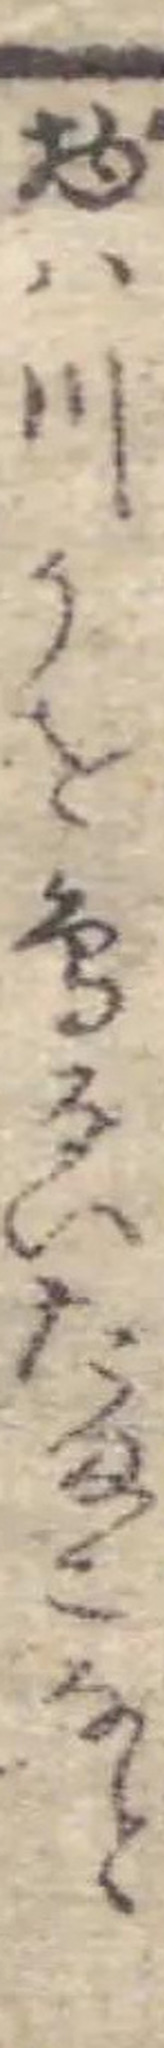物は川うを鳥るいたまこなど
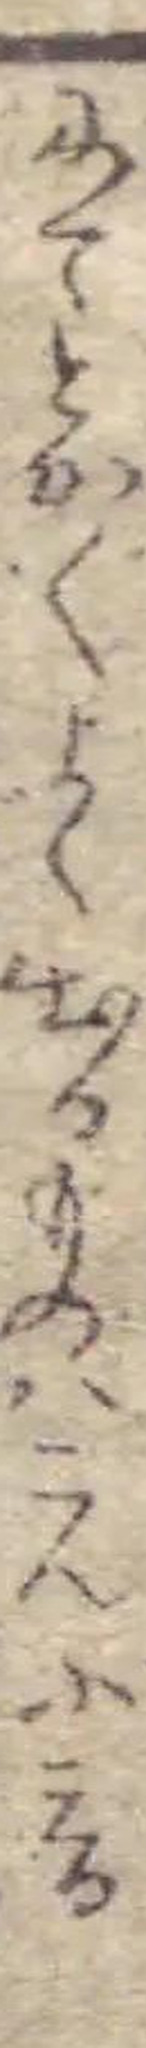にてとかくよく出るものはこんぶみる
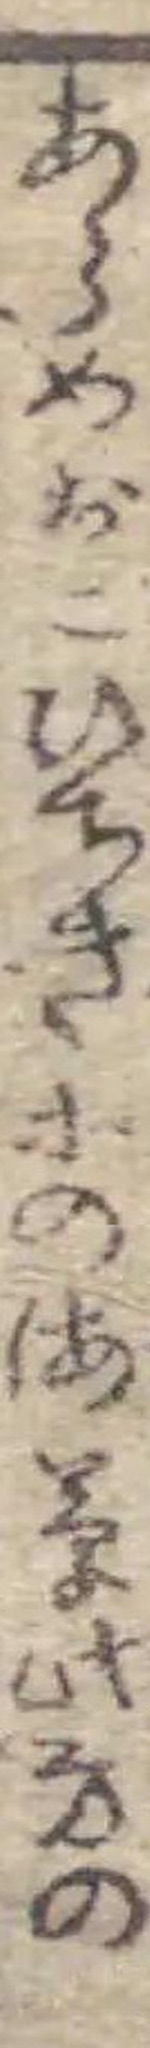あらめおごひぢき等の海草此方の
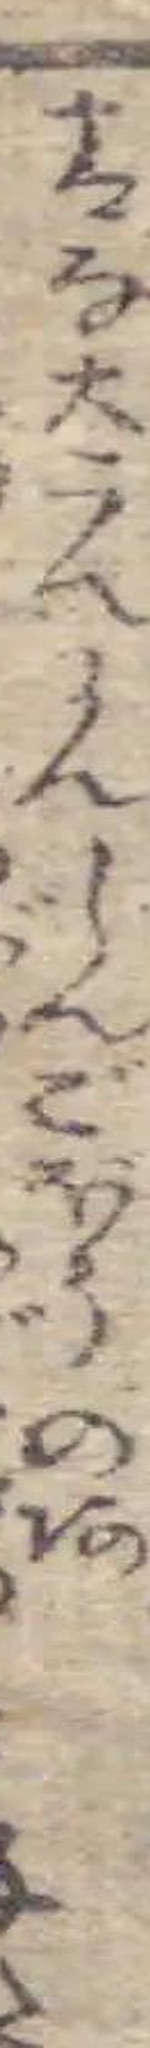青な大こんにんじんごぼうのあ
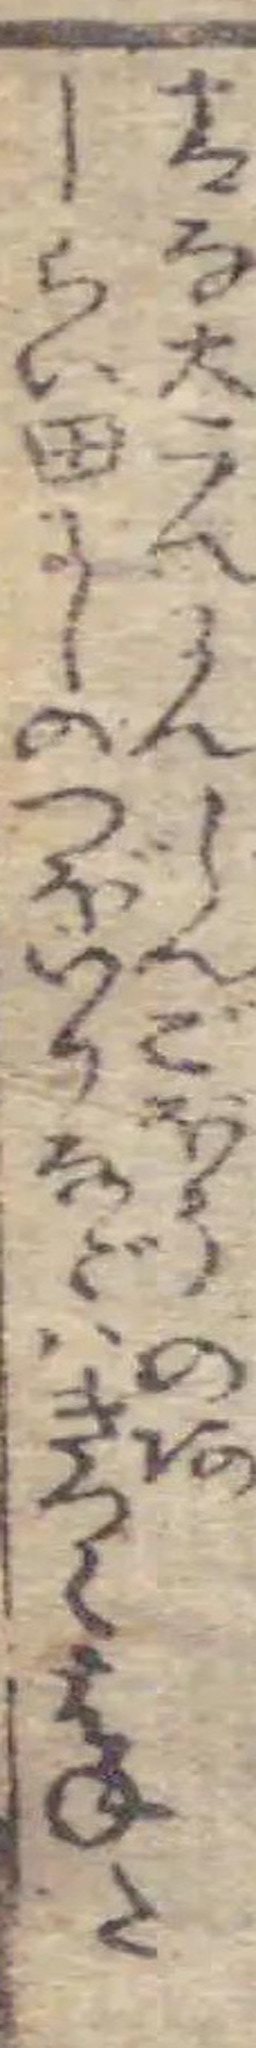しらい田にしのつぼいりなどはきつくはねた

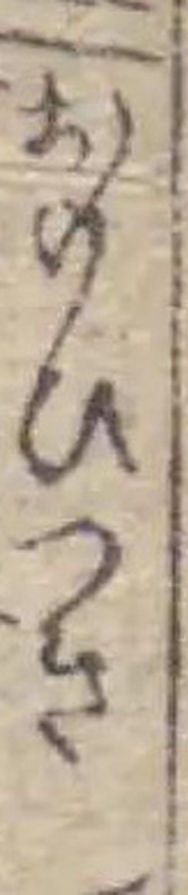おもひつき
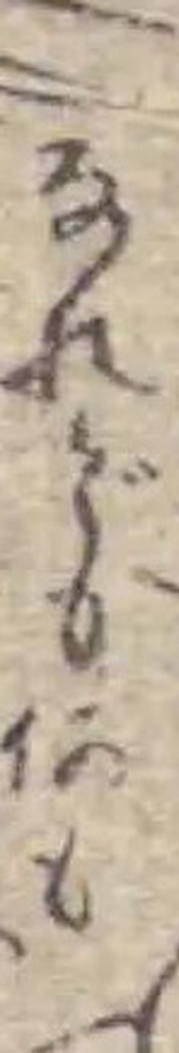なれども何も
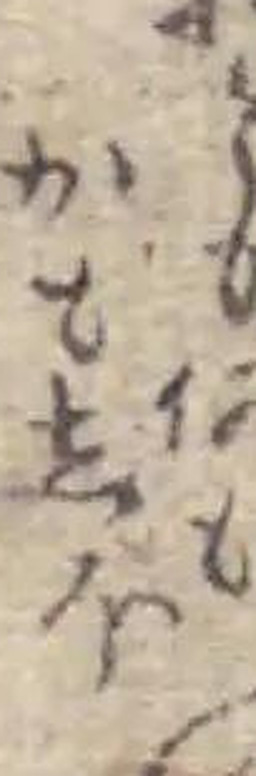かもしほ
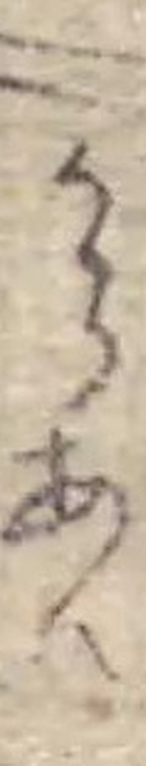からあん
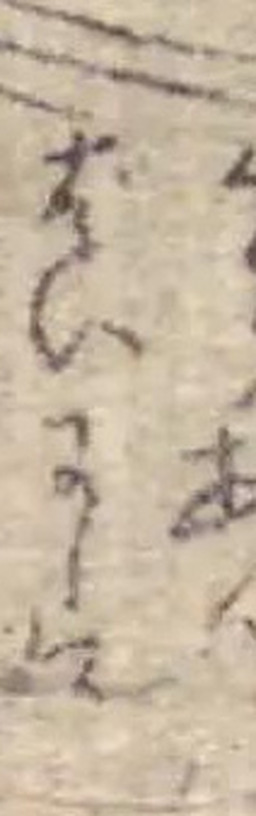ばいにして
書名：見立蓬莱 : 2巻
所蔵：国立国会図書館 National Diet Library, JAPAN
